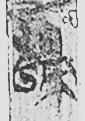{𡴎帚}
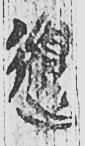{辶須}
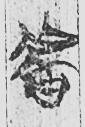者
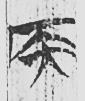侯
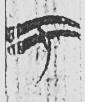于
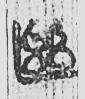{𠃊𢆶}
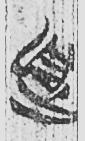{首止}
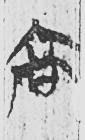高
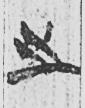之
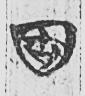固
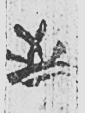至
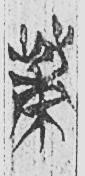莆
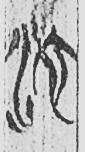池
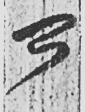乃
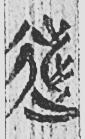逃
